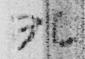九
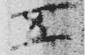五
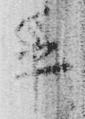孚
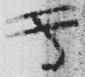于
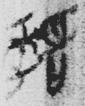嘉
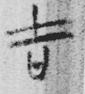吉
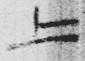上
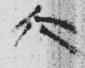六
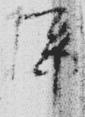係
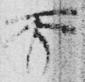而
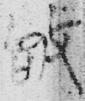敂（扣）
